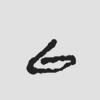㠯（以）
